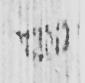四
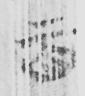百
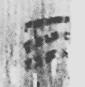三
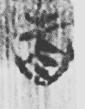百
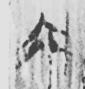六
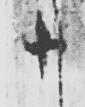十
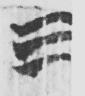三
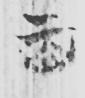百
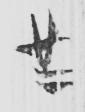廿=
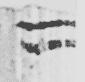二
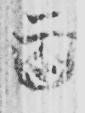百
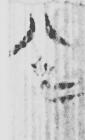八十=
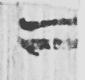二
